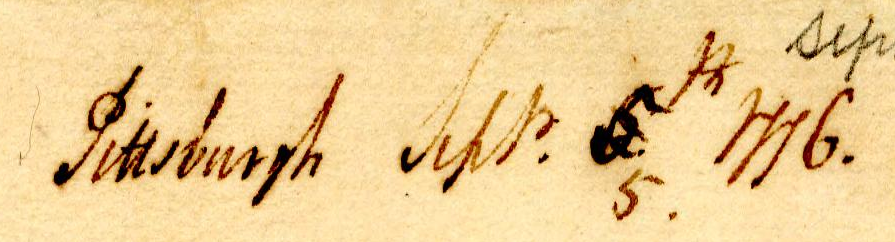Pittsburgh Sept^r. 5^th. 1776.
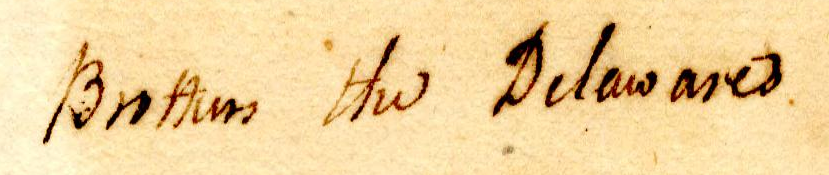Brothers the Delawares
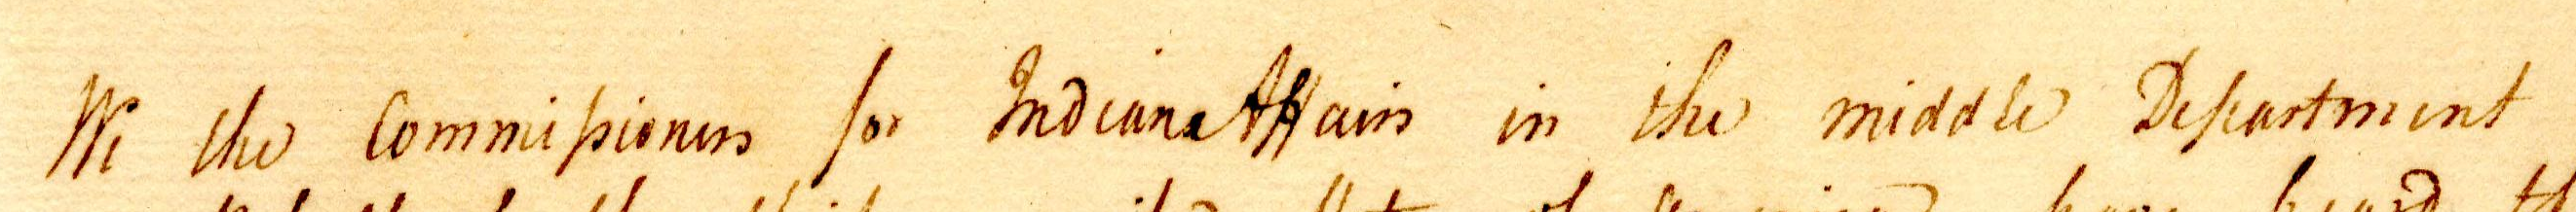We the Commissioners for Indian Affairs in the Middle Department
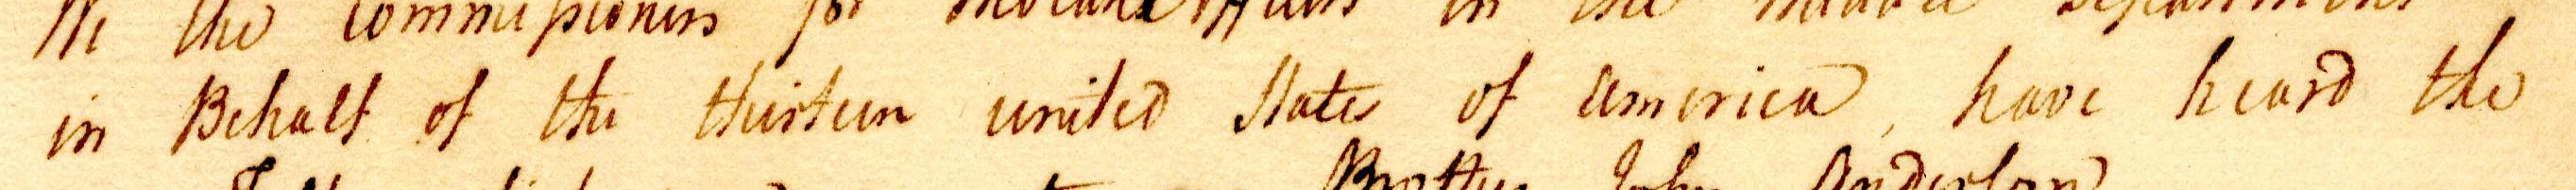in Behalf of the thirteen united States of America have heard the
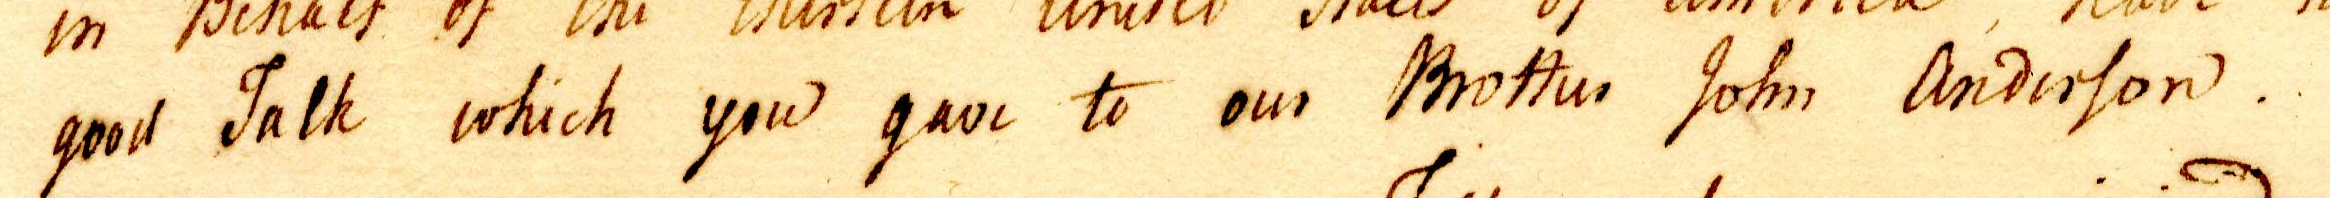good Talk which you gave to our Brother John Anderson.
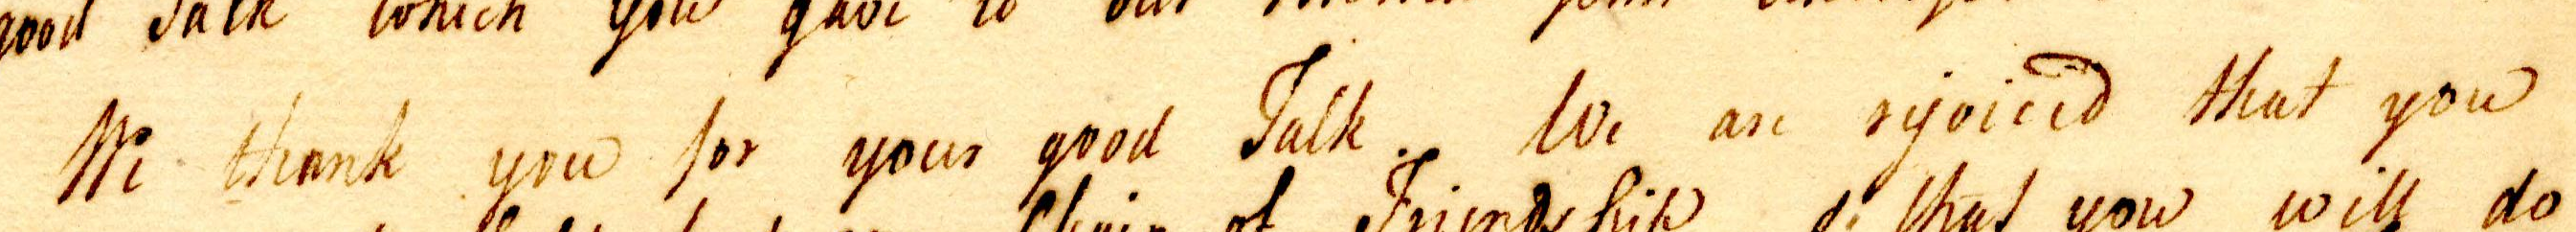We thank you for your good Talk. We are rejoiced that you
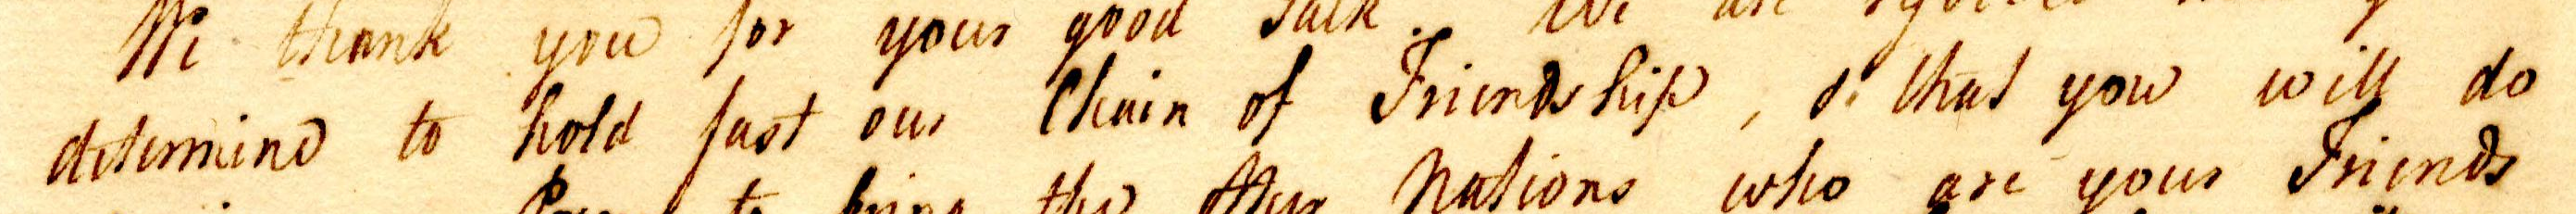determine to hold fast our Chain of Friendship, & that you will do
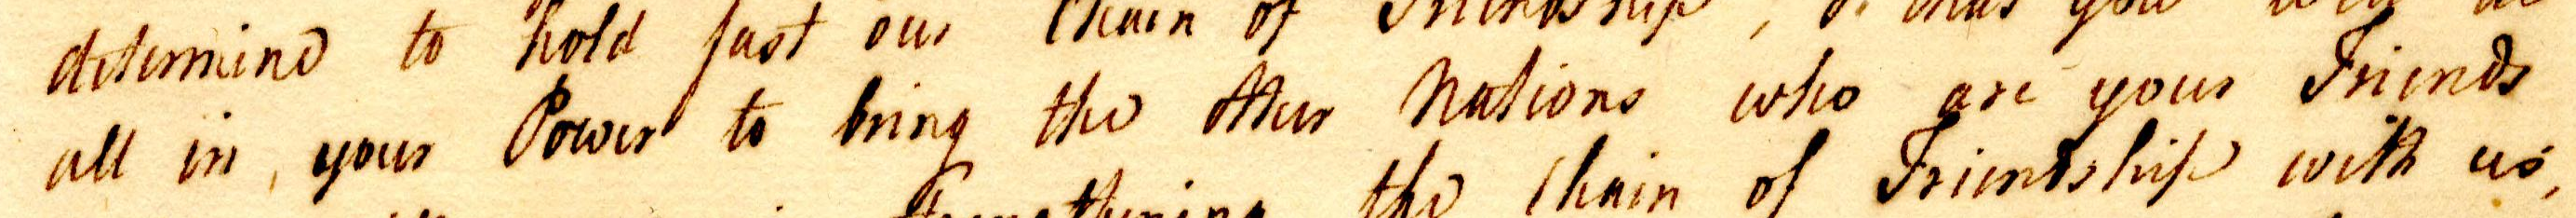all in your Power to bring the other Nations who are your Friends
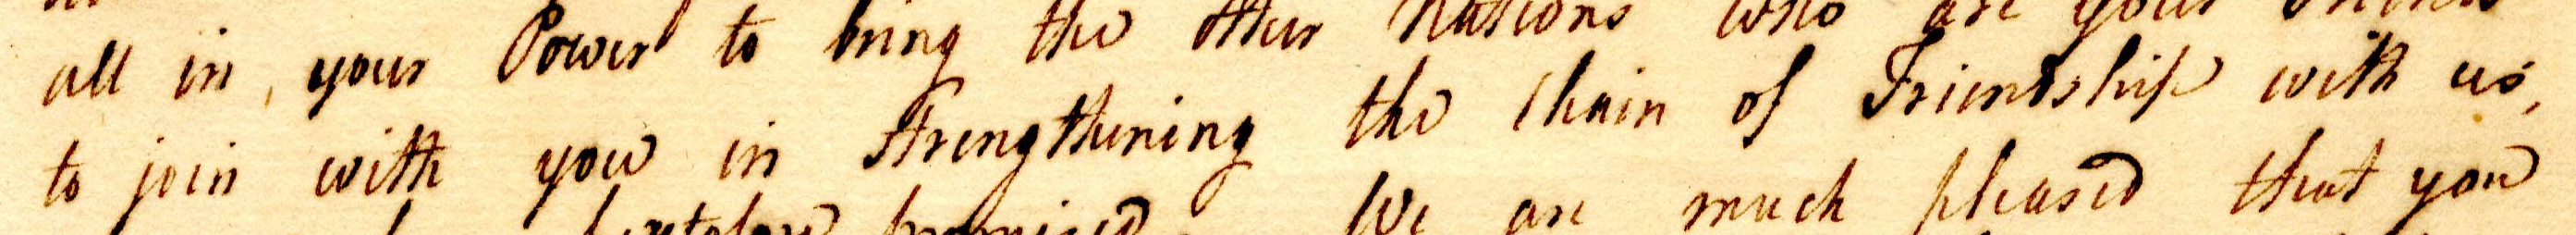to join with you in Strengthening the Chain of Friendship with us
